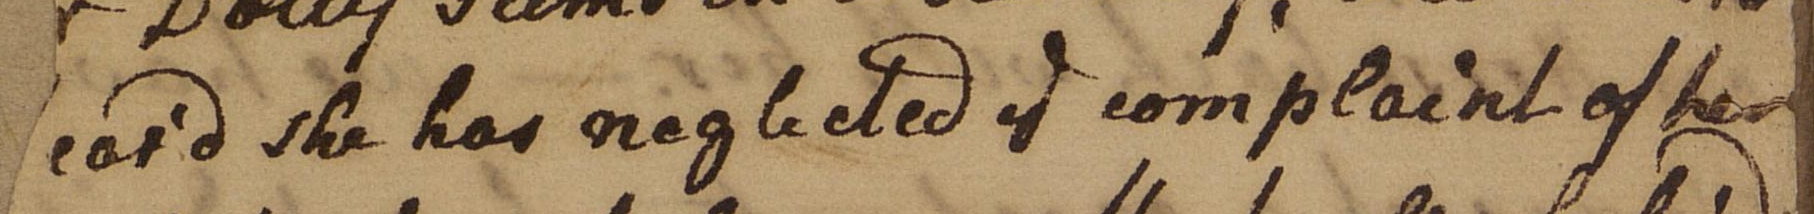cas'd she has neglected y^e complaint of her
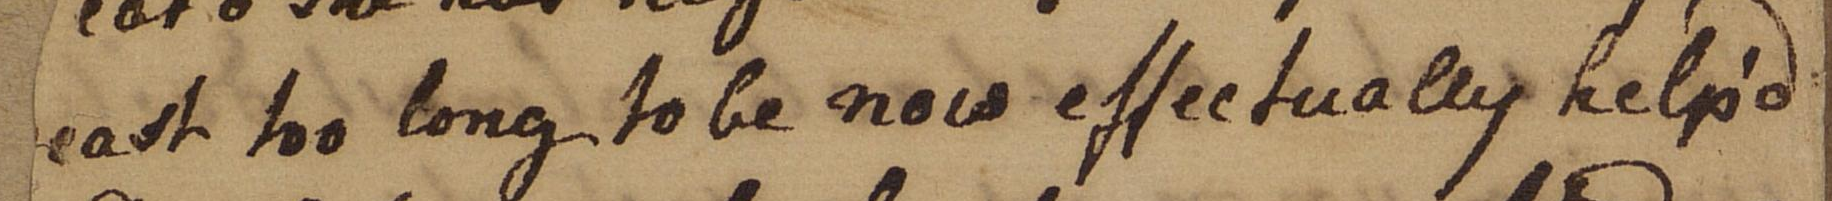cast too long to be now effectually help'd
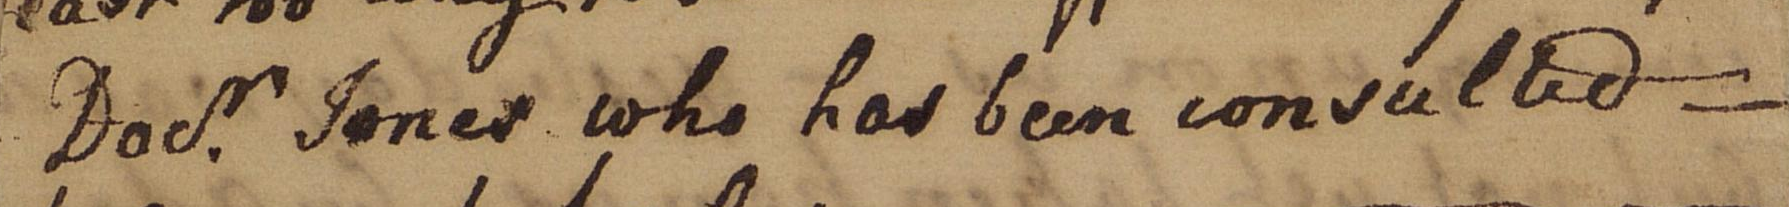Doc^r. Jones who has been consulted-
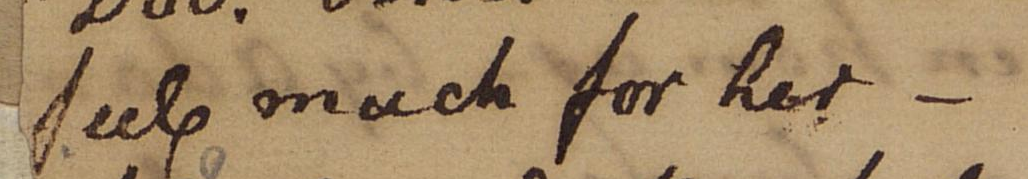feels much for her-
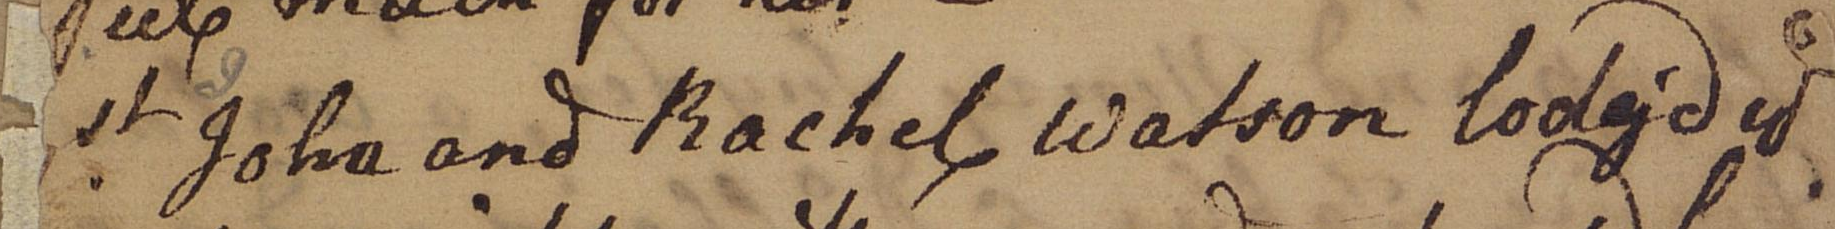^st. John and Rachel Watson lodg'd y^e
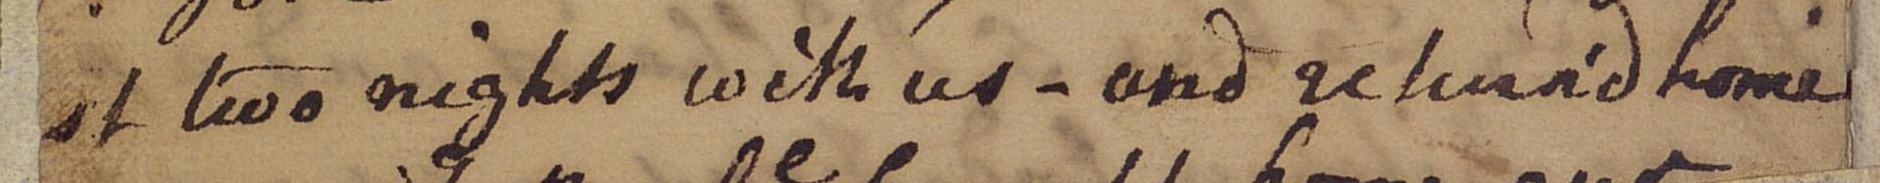st two nights with us- and return'd home
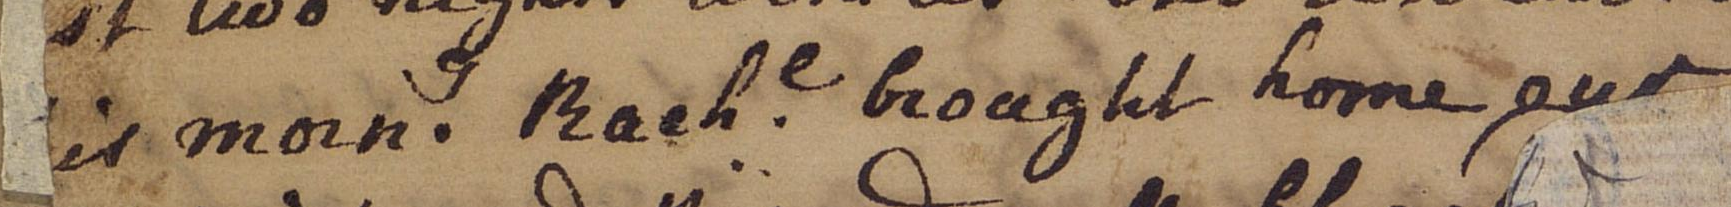is morn^g. Rach^l brought home our
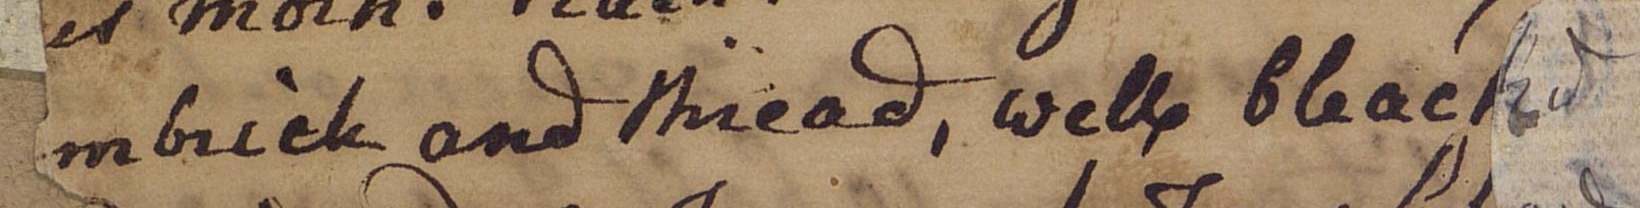mbrick and thread, well bleackd
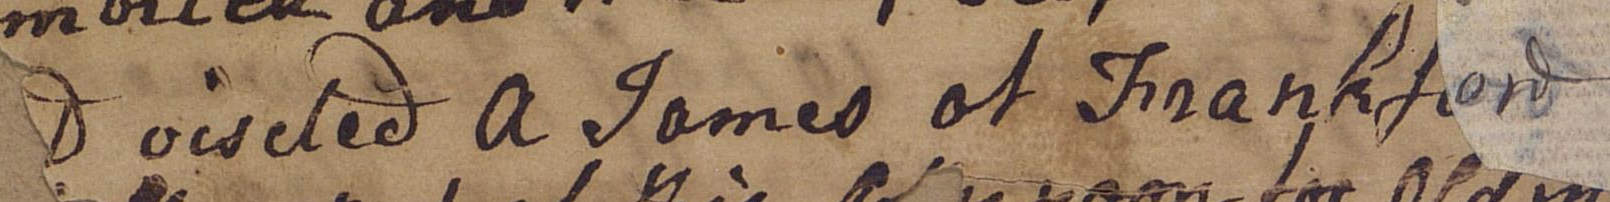D visited a James at Frankford
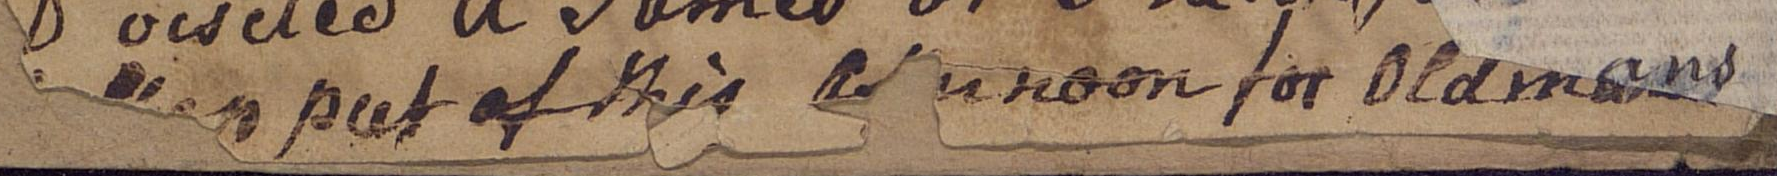[_____] put of this Afternoon for old mans
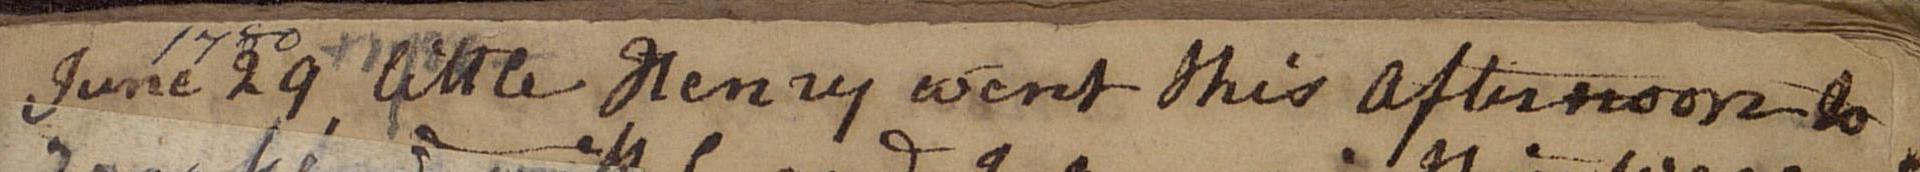June 29, little Henry went this Afternoon to
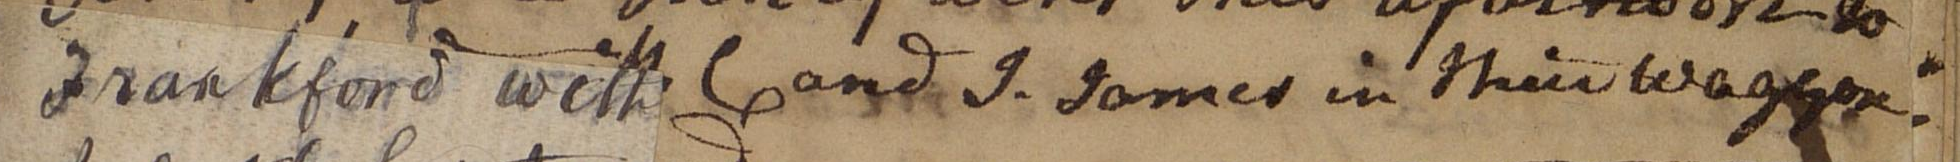Frankford with C and I. James in their waggon
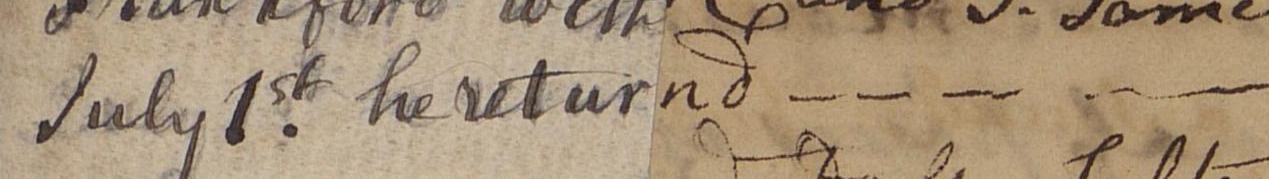July 1^st. he returnd--- --
